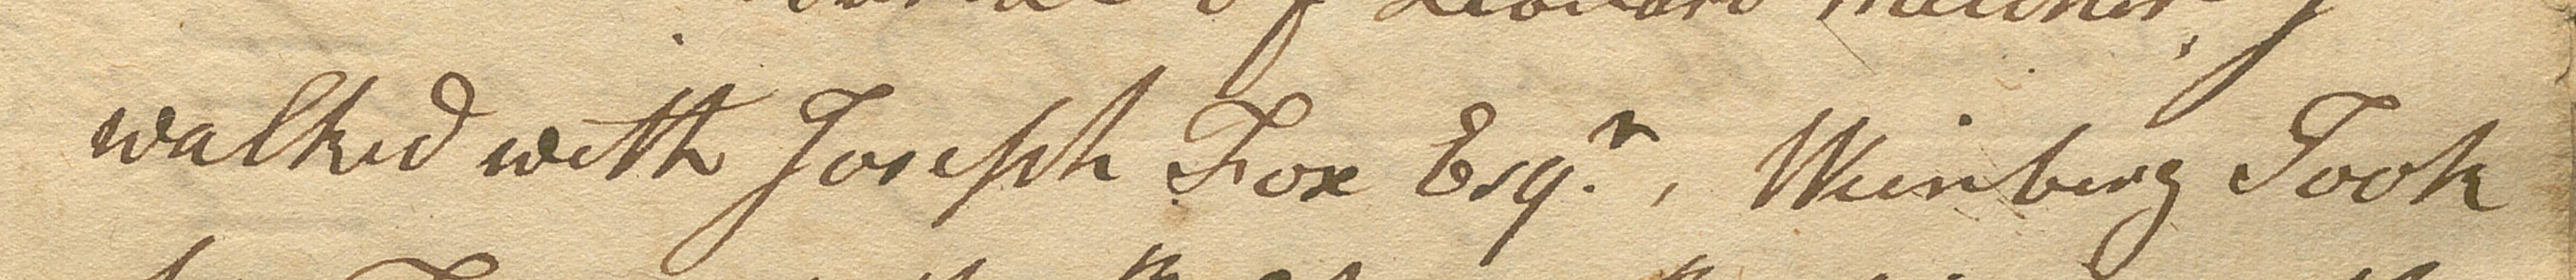walked with Joseph Fox Esq^r., Weinberg Took
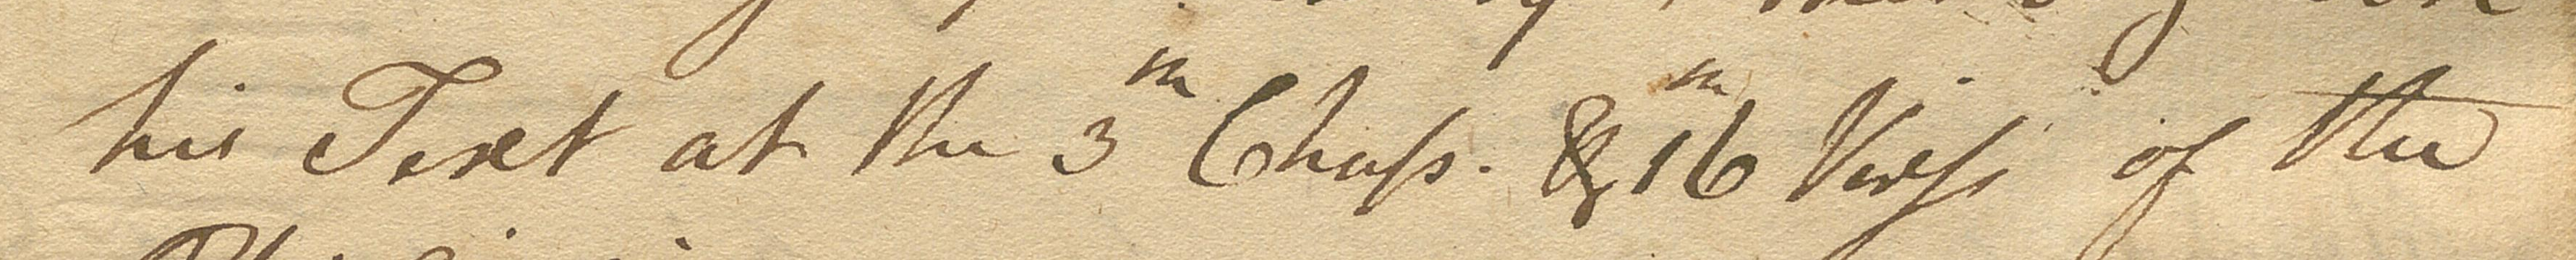his Text at the 3^th Chap. & 16th Verss of the
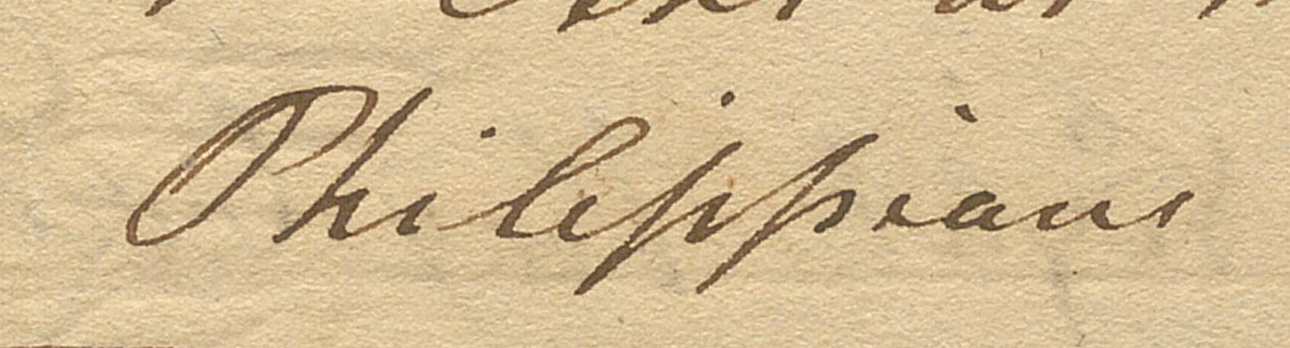Philippians
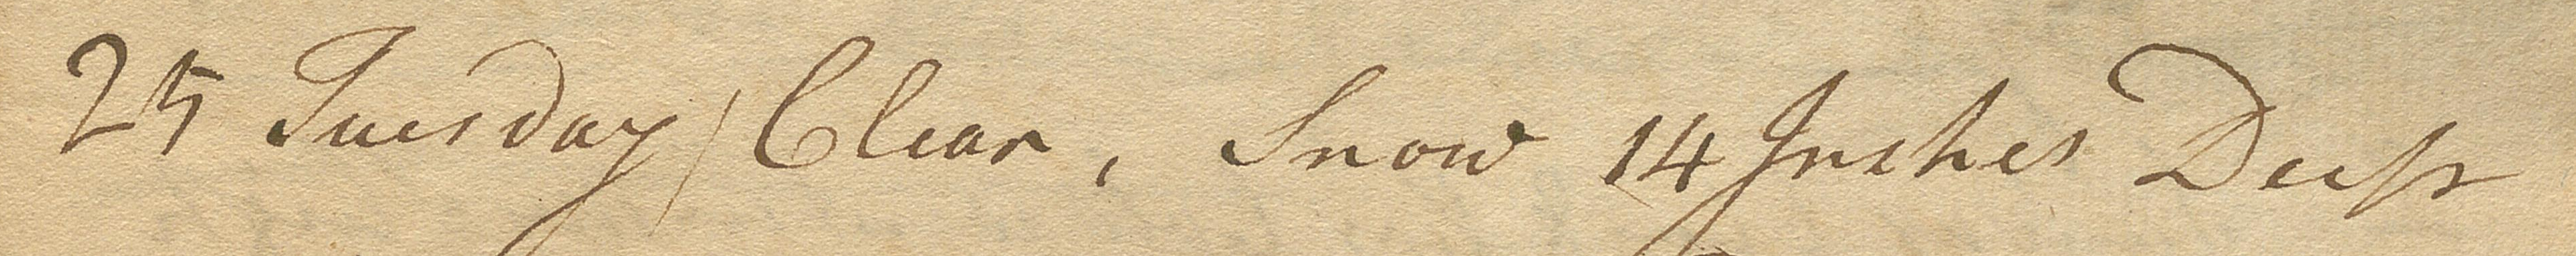25 Tuesday Clear, Snow 14 Inches Deep
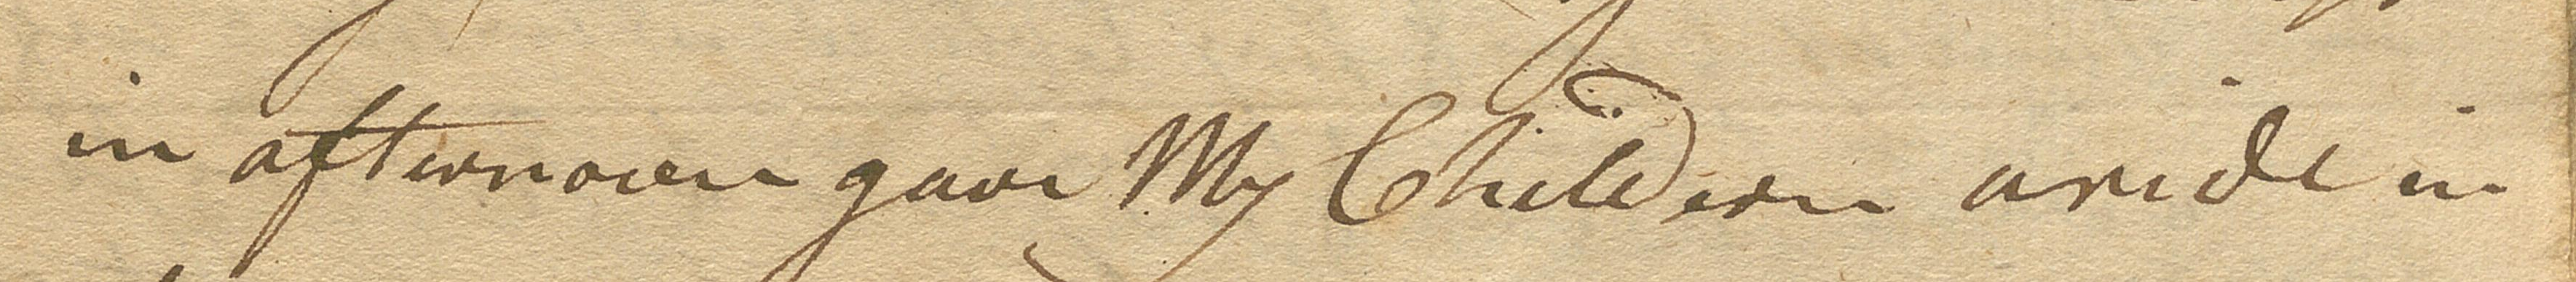in afternoon gave My Childern a ride in
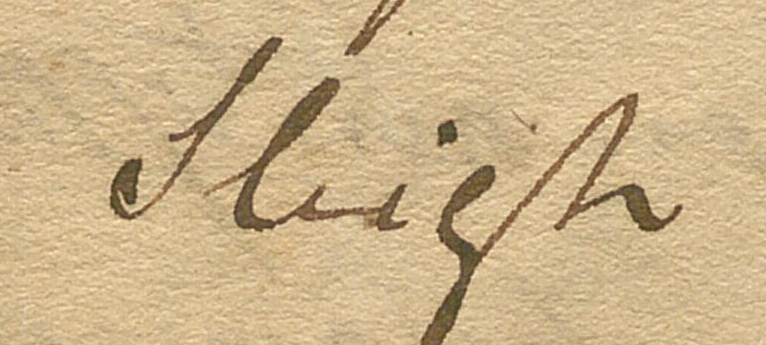Sleigh
